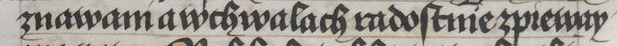znawam a wchwalach radoſtnie zpieway¬
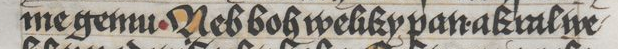me gemu.Neb boh weliky pan a kral we¬
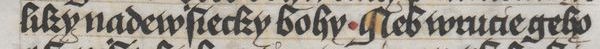liky nadewẛiecky bohy.Neb wrucie geho
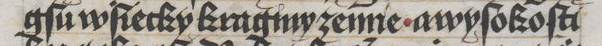gſu wẛiecky kraginy zemie.a wyſokoſti¬
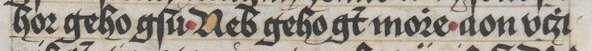hor geho gſu.Neb geho ḡt moṙe.a on vcżi¬
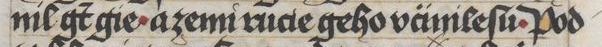nil ḡt gie.a zemi rucie geho vċinileſu.Pod¬
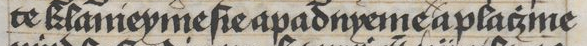te klanieyme ſie apadnyeme a placżme
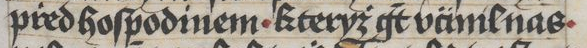pṙed hoſpodinem.kteryż ḡt uċinil nas.
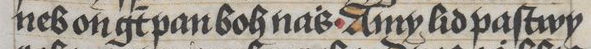neb on ḡt pan boh naṡ.Amy lid paſtwy
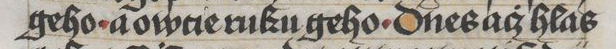geho.a owcie ruku geho.Dnes acż hlas
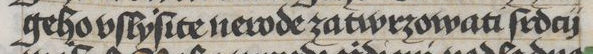geho vſlyẛite nerode zatwrzowati ſrdcij
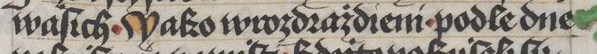waẛich.Yako wrozdrażdieni.podle dne.
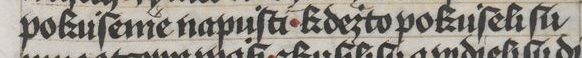pokuẛenie napuẛti.kdeżto pokuẛeli ſu
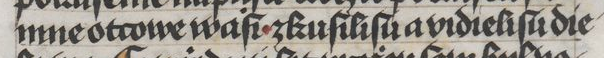mne otcowe waẛi.zkuſiliſu a vidieli ſu die¬
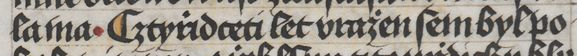la ma.Cztyṙidceti let vrażen ſem byl po¬
